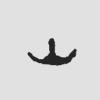山
